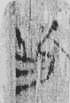此
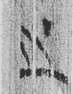之
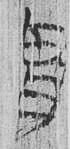胃（謂）
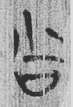○（小）
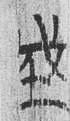城（成）
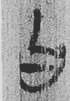曰
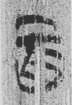百
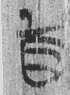眚（姓）
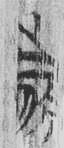之所
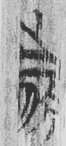所
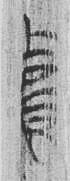貴
